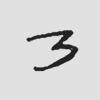乃
